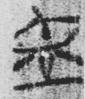蛊（蠱）
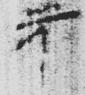元
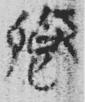卿（亨）
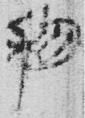利
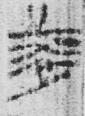涉
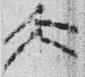大
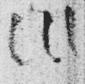川
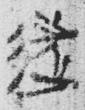选（先）
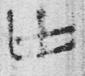甲
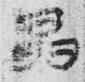晶（三）
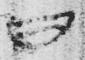日
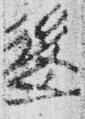○（後）
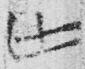甲
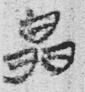晶（三）
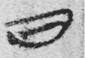日
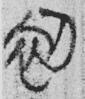初
